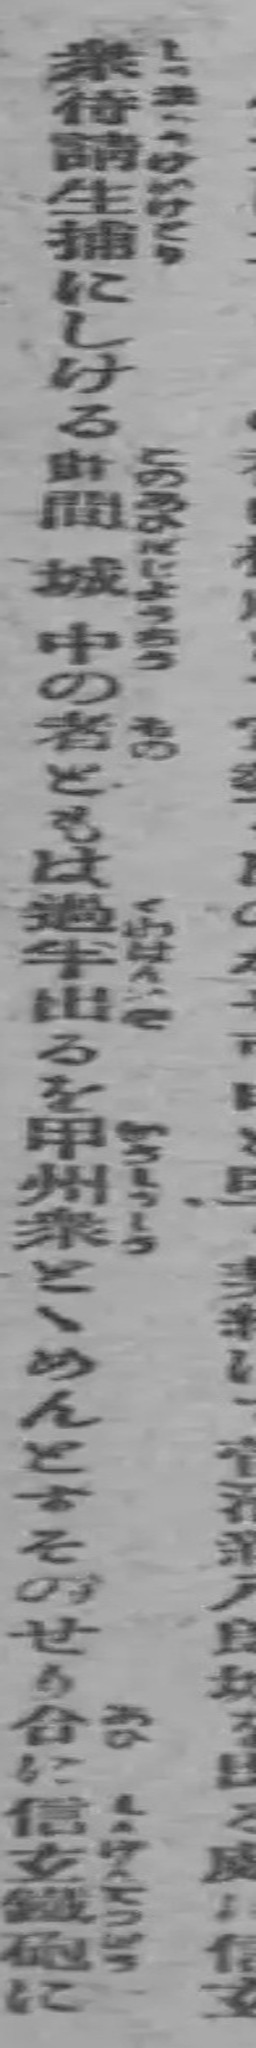衆待請生捕にしける此間城中の者ともは過半出るを甲州衆とゝめんとすそのせり合に信玄鉄砲に

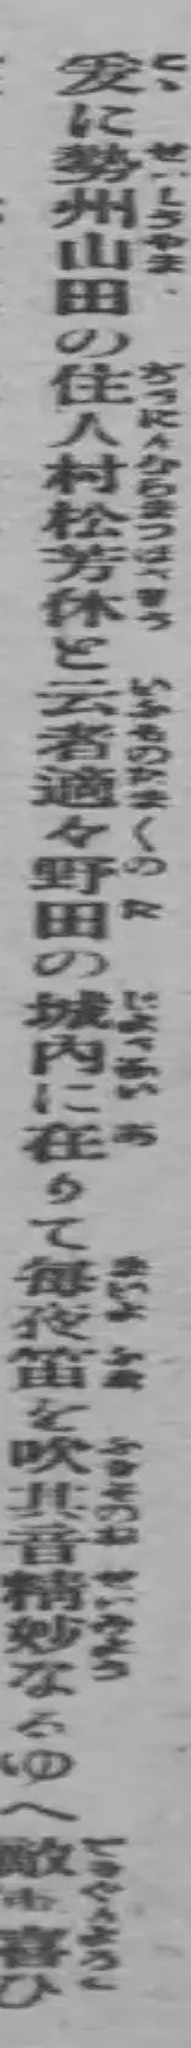爰に勢州山田の住人村松芳休と云者適々野田の城内に在りて毎夜笛を吹其音精妙なるゆへ敵軍喜び
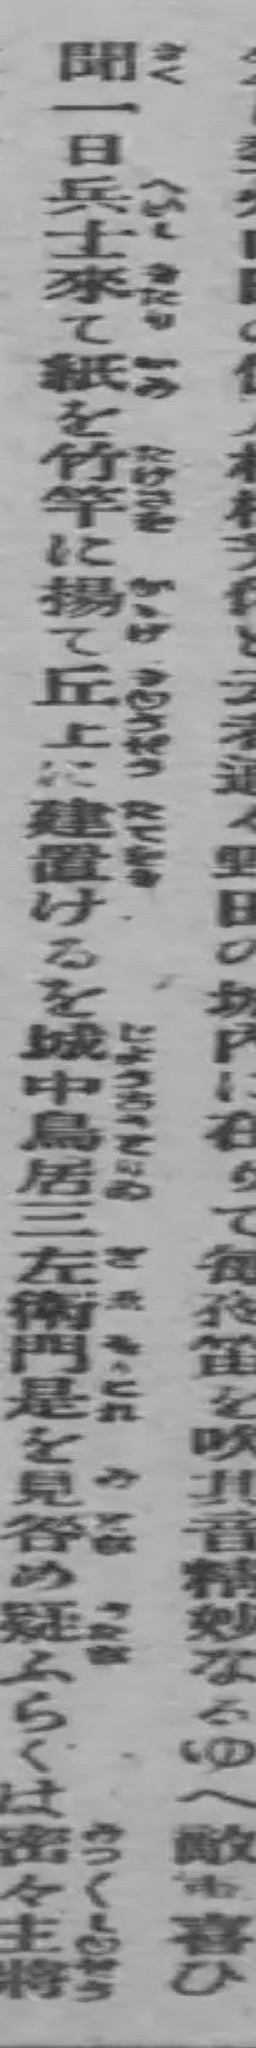聞一日兵士来て紙を竹竿に掲て丘上に建置けるを城中鳥居三左衛門是を見咎め疑ふらくは蜜々主将
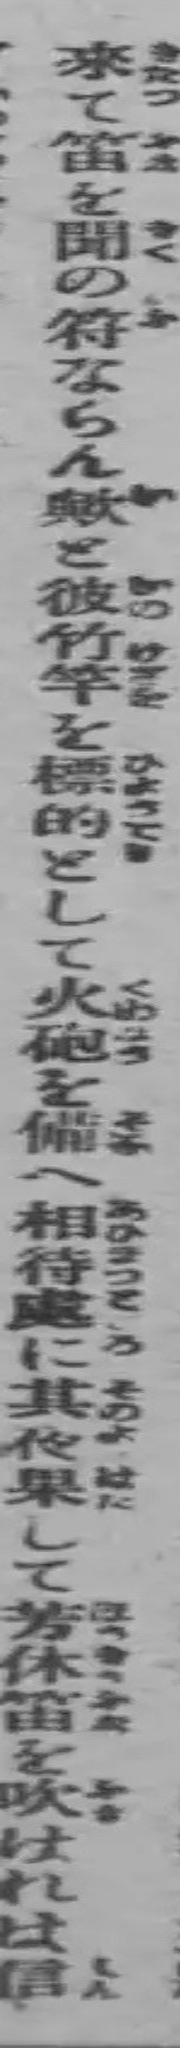来て笛を聞の符ならん歟と彼竹竿を標的として火砲を備へ相待処に其夜果して芳休笛を吹けれは信
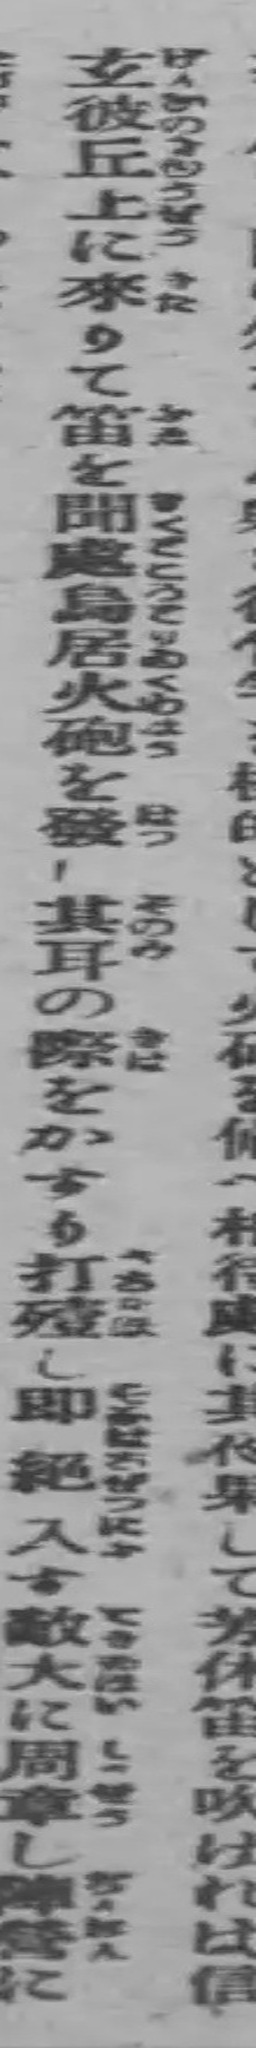玄彼丘上に来りて笛を聞処鳥居火砲を発し其耳の際をかすり打殪し即絶入す敵大に周章し陣営に
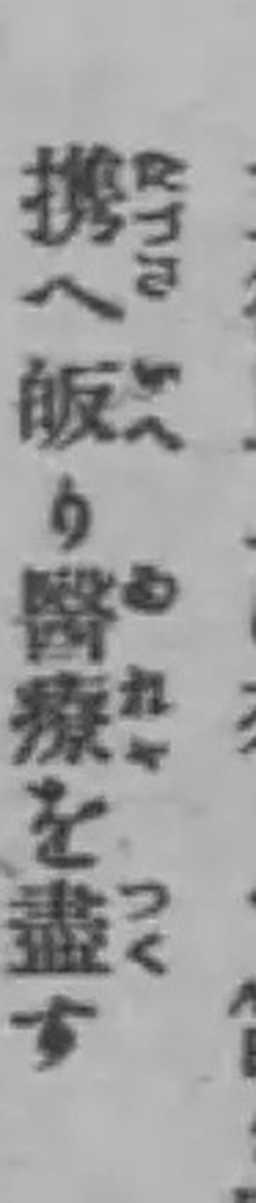携へ皈り医療を尽す
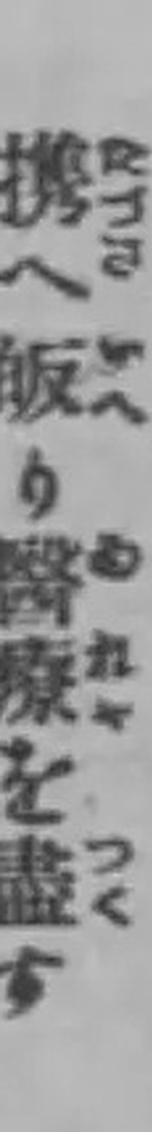携へ皈り医療を尽す
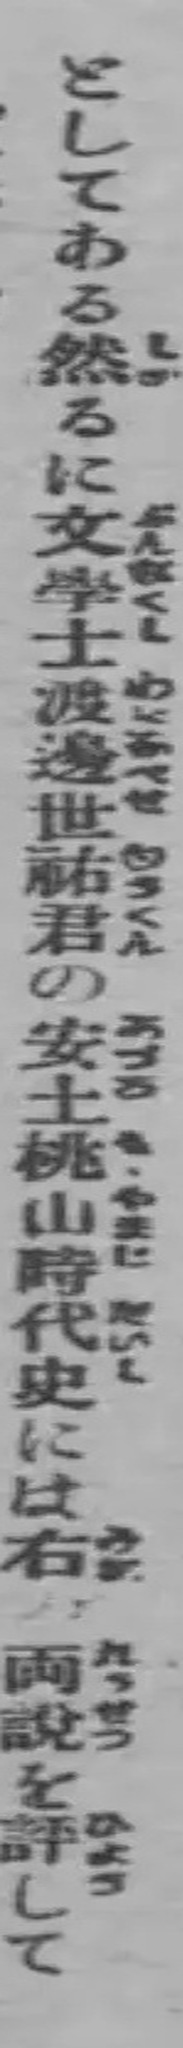としてある然るに文学士渡邊世祐君の安土桃山時代史には右の両説を評して
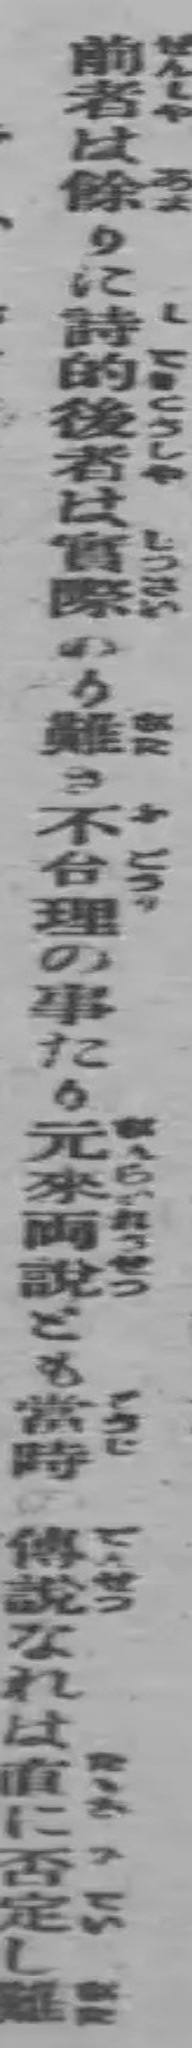前者は余りに詩的後者は実際あり難き不合理の事たり元来両説とも当時の伝説なれは直に否定し難
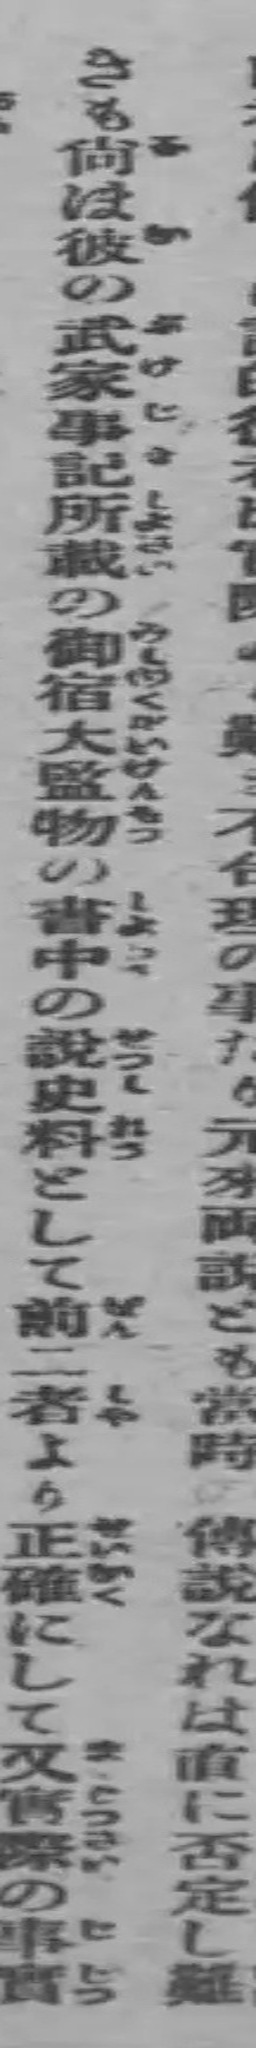きも尚ほ彼の武家事記所載の御宿大監物の書中の説史料として前二者より正確にして又実際の事実
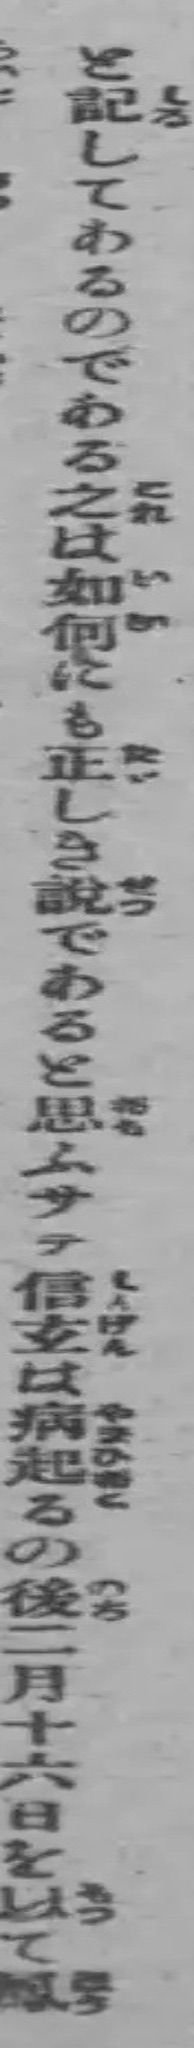と記してあるのである之は如何にも正しき説であると思ふサテ信玄は病起るの後二月十六日を以て鳳
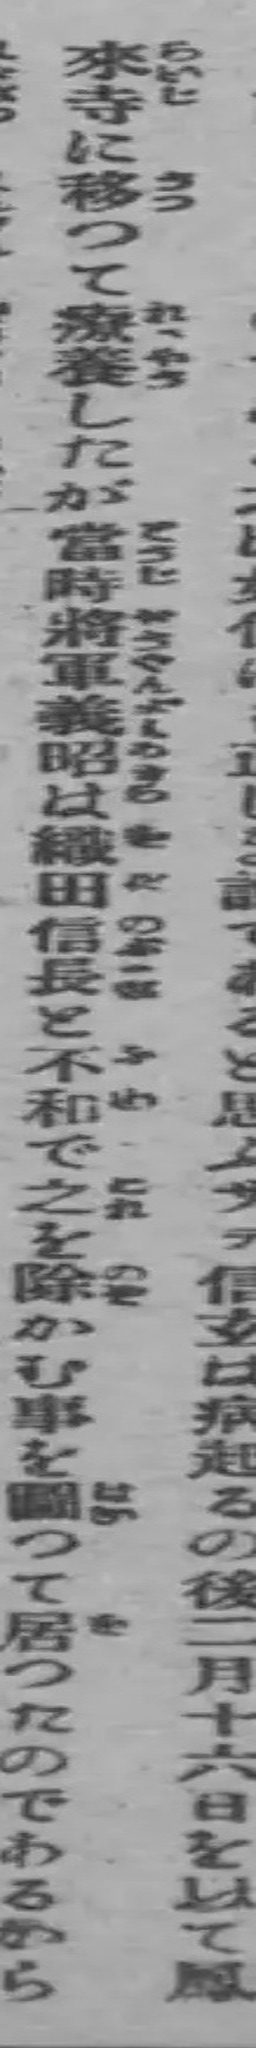来寺に移つて療養したが当時将軍義昭は織田信長と不和で之を除かむ事を画つて居つたのであるから
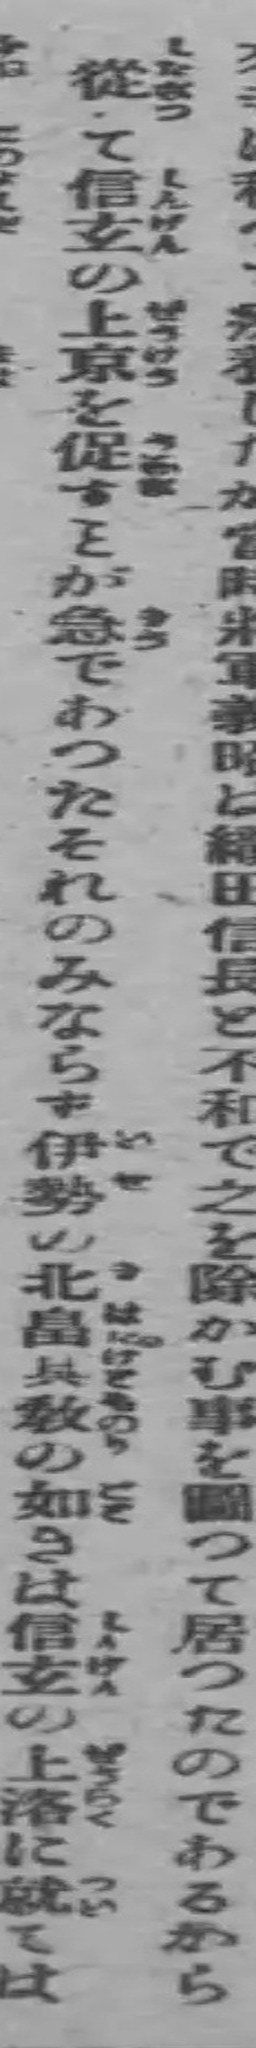従て信玄の上京を促すことが急であつたそれのみならず伊勢の北畠具教の如きは信玄の上洛に就ては
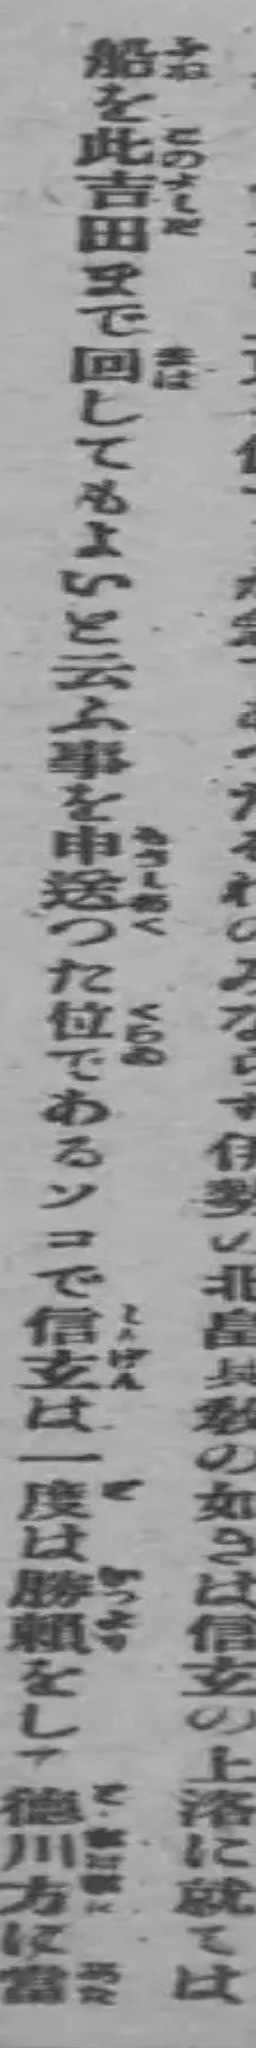船を此吉田まで回してもよいと云ふ事を申送つた位であるソコで信玄は一度は勝頼をして徳川方に当
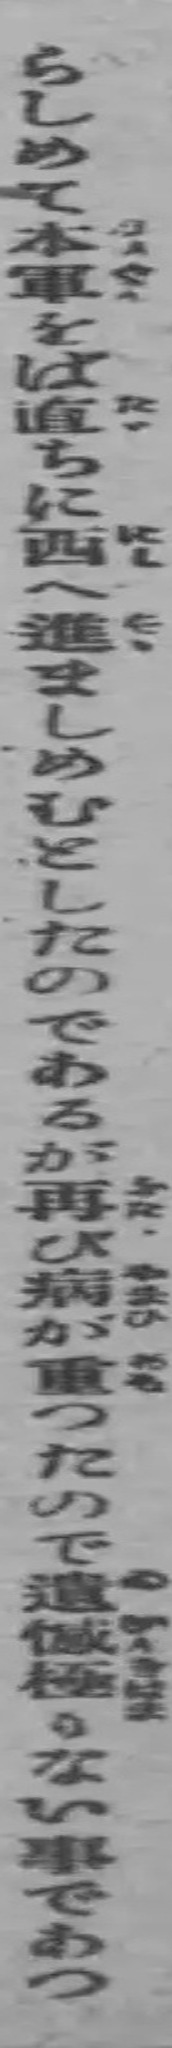らしめて本軍をば直ちに西へ進ましめむとしたのであるが再び病が重つたので遺憾極りない事であつ
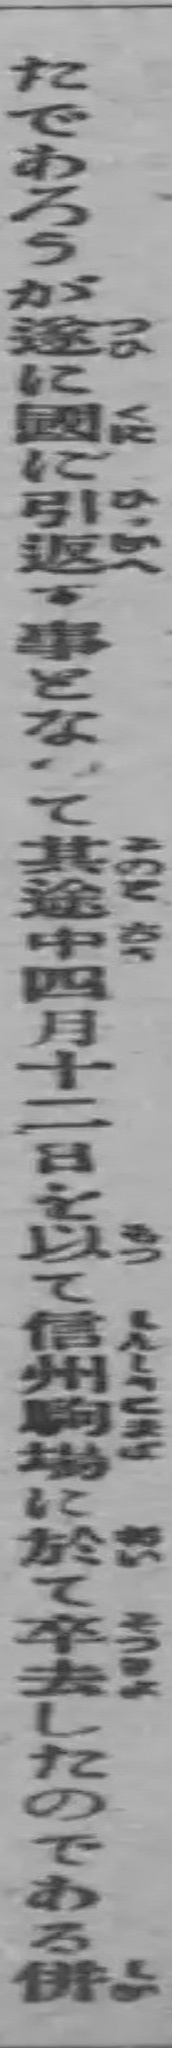たであろうが遂に国に引返す事となつて其途中四月十二日を以て信州駒場に於て卒去したのである併
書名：豊橋市史談
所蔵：国立国会図書館 National Diet Library, JAPAN
